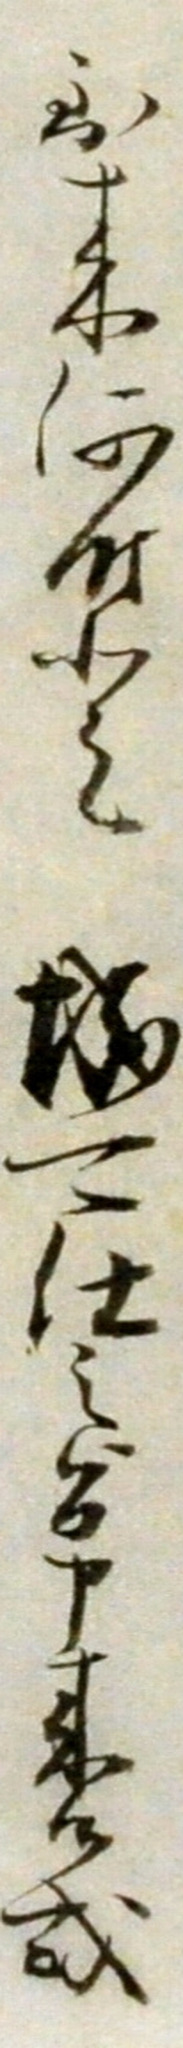到来何時登城可仕之旨申来候或
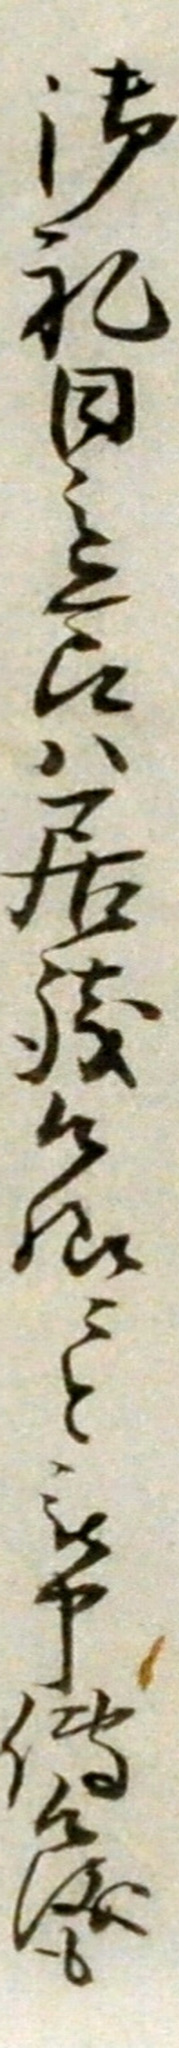御礼日之節は居残候様にと被申伝候儀も
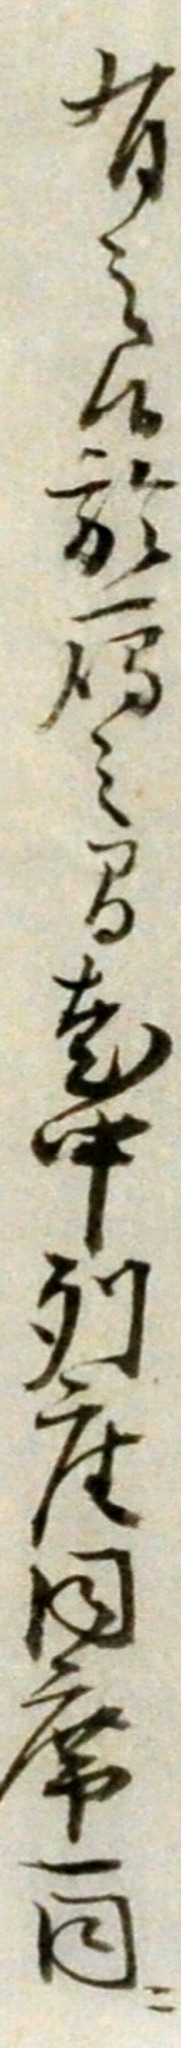有之候御雁之間老中列座同席一同に
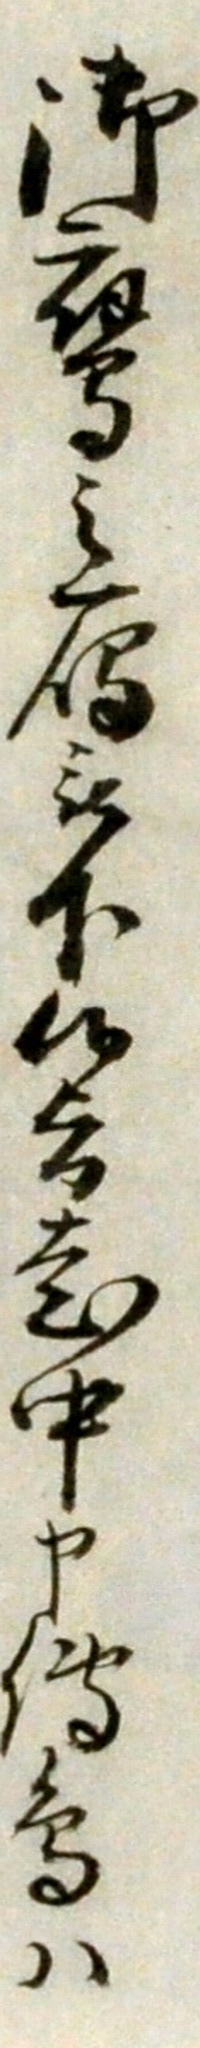御鷹之雁被下候旨老中申伝鳥は
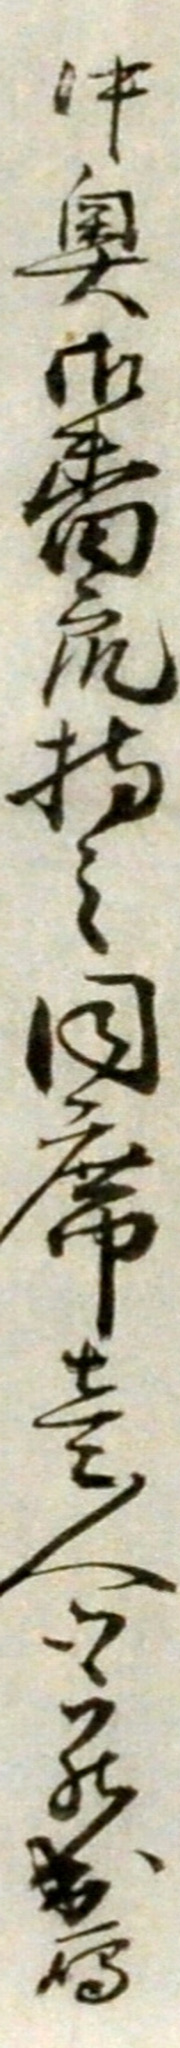中奥御番衆持之同席壱人ツヽ罷出雁
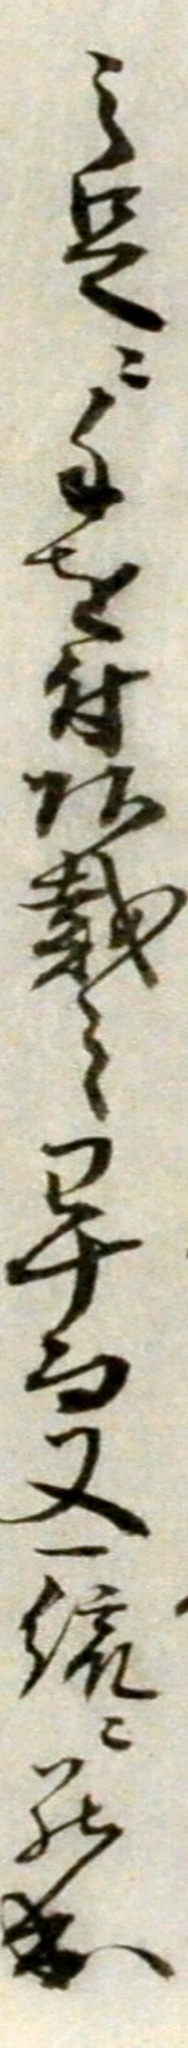之足に手を付頂戴之畢て又一統に罷出
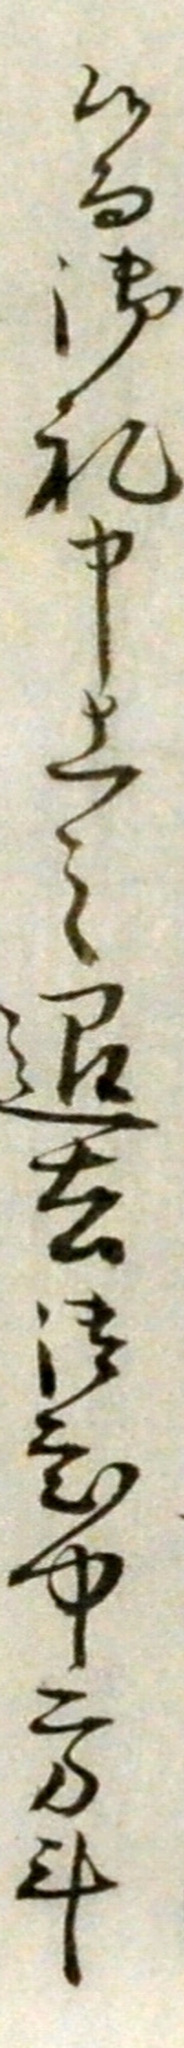候て御礼申上之退去御老中方斗
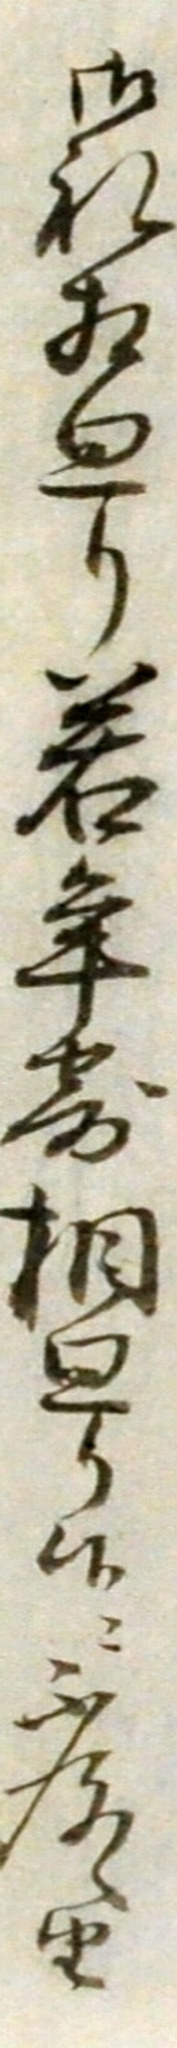御礼相廻り若年寄相廻り候に不及候由
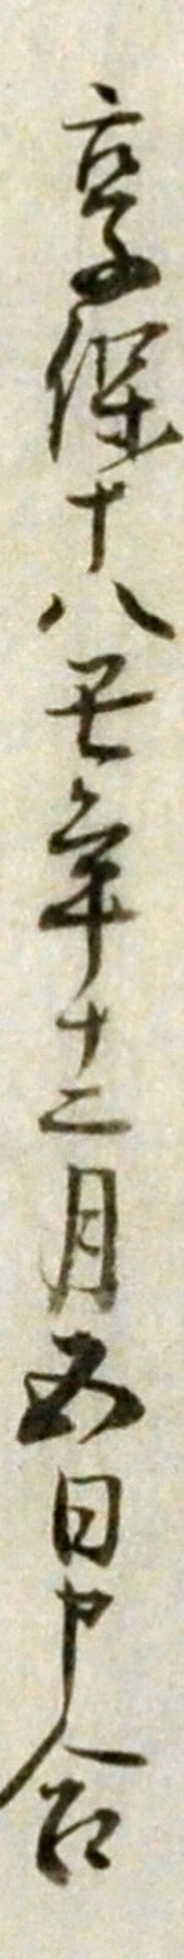享保十八丑年十二月五日申合
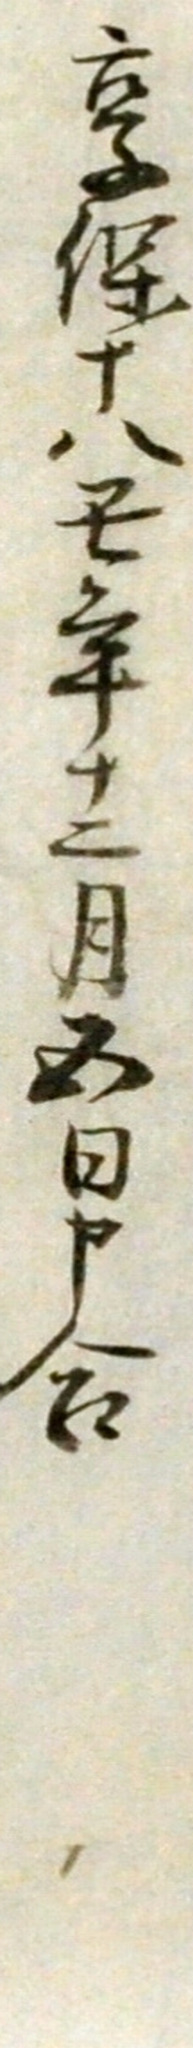享保十八丑年十二月五日申合
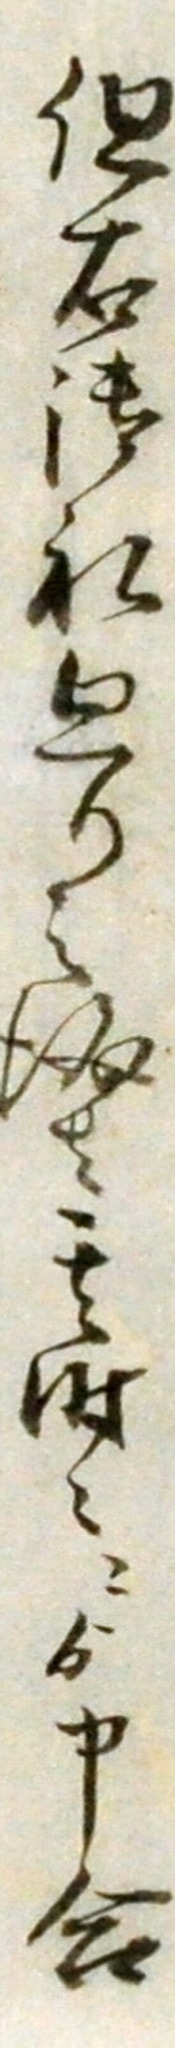但右御礼廻り之儀は其時々にゟ申合
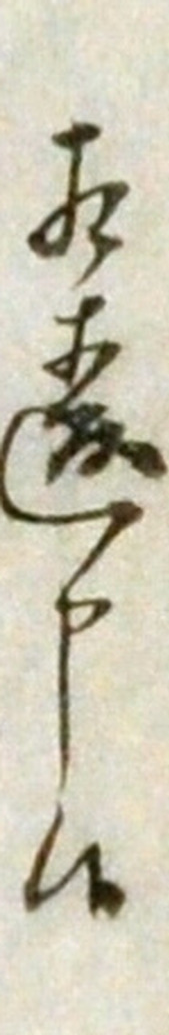相違申候
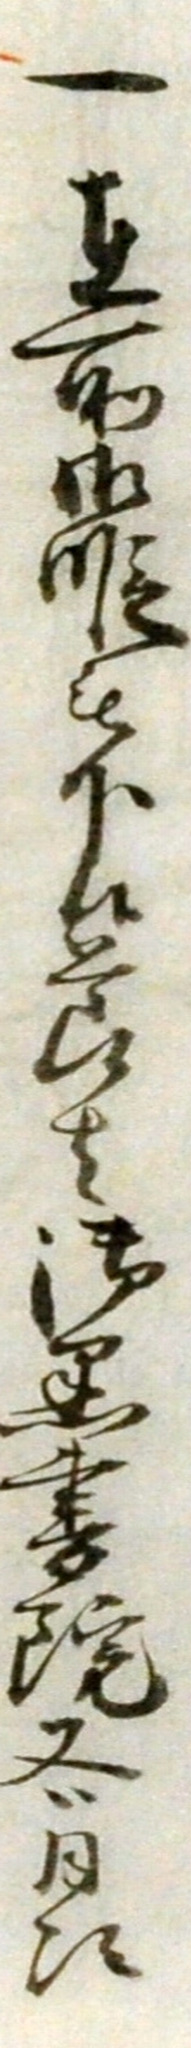一在所御暇被下候節は御黒書院又は月次
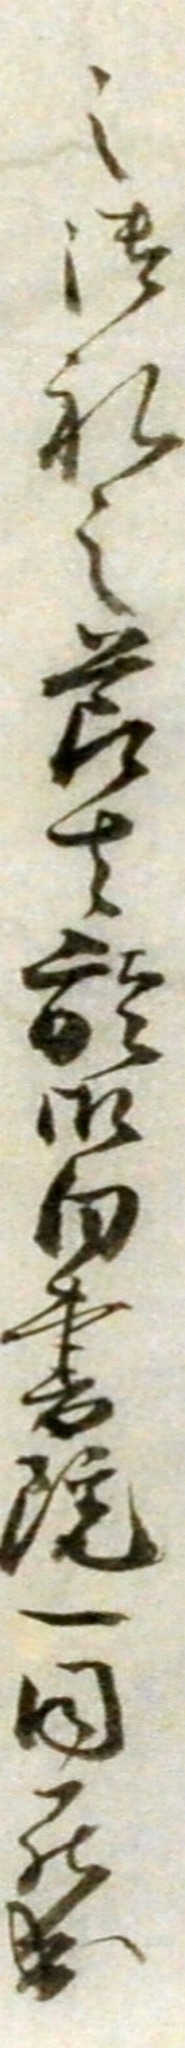之御礼之節は御御白書院一同罷出
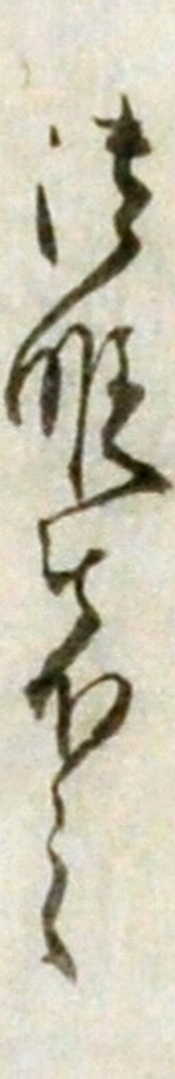御暇被下之
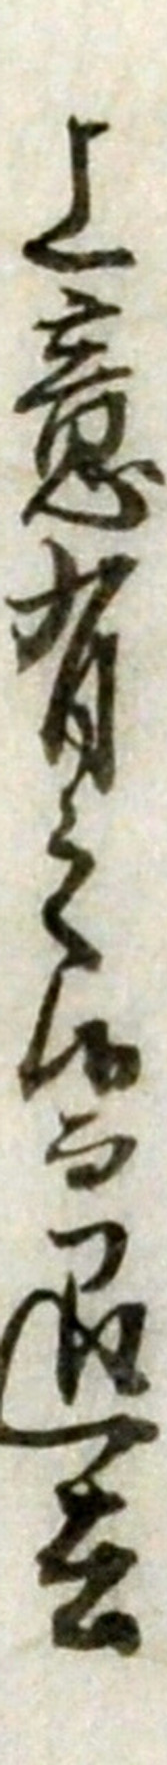上意有之候て退去
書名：申合帳〔一括〕
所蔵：伊那市立高遠町図書館・合同会社AMANE
